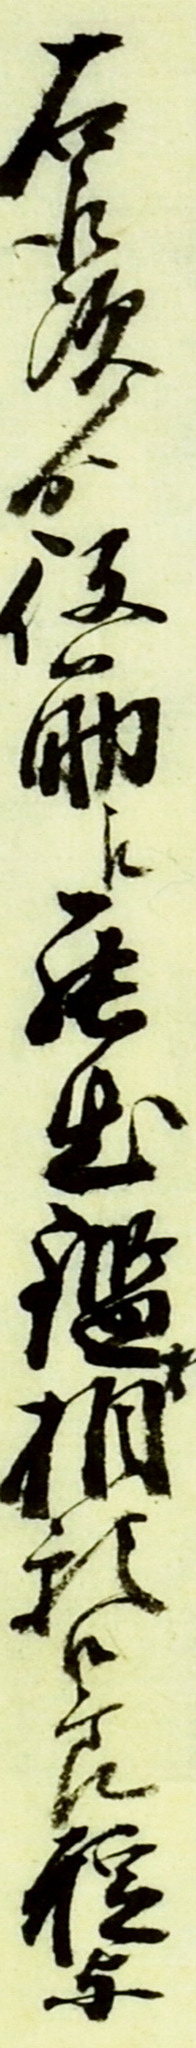右取次ゟ役筋江罷出鑑札相願候節聢与
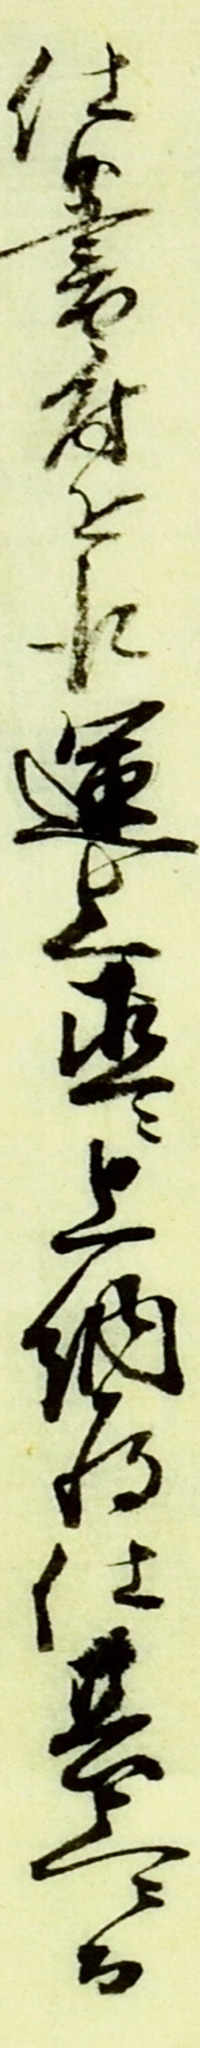仕候書付を取運上直ニ上納為仕其上ｎニ而
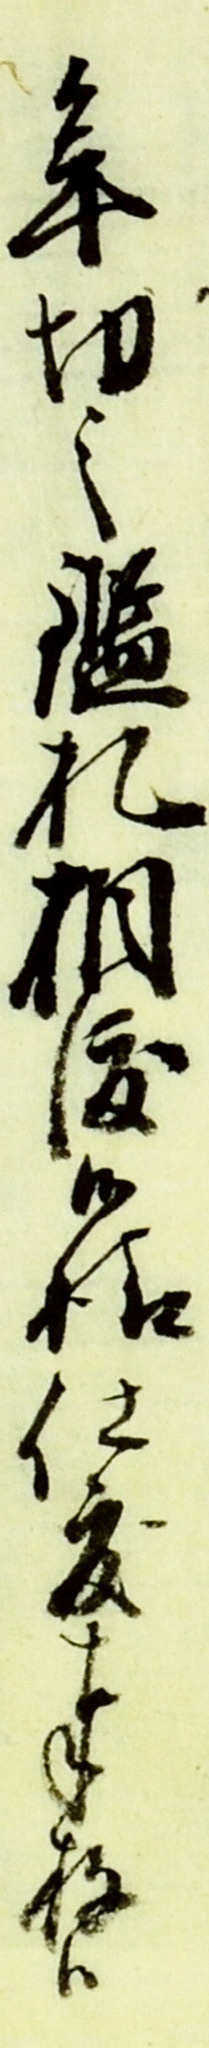年切之鑑札相渡候様仕度奉存候
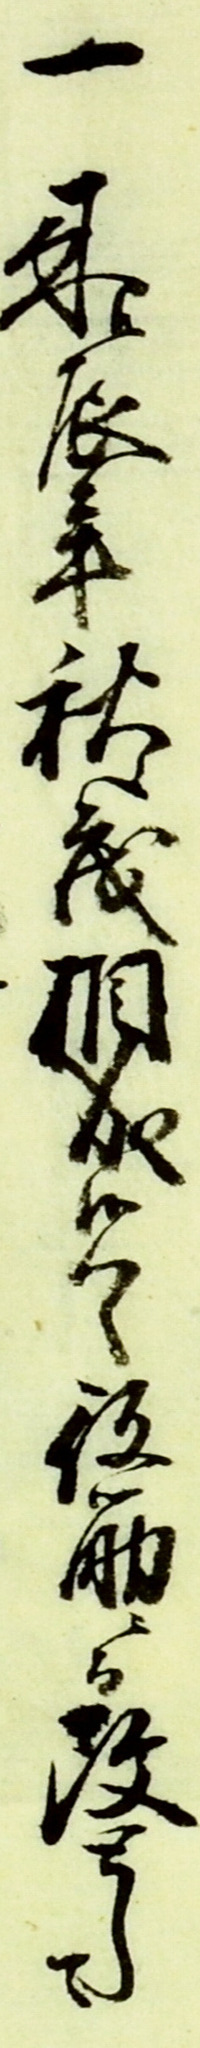一来ル辰年秋ニ茂相成候ハヽ役筋ニ而改として
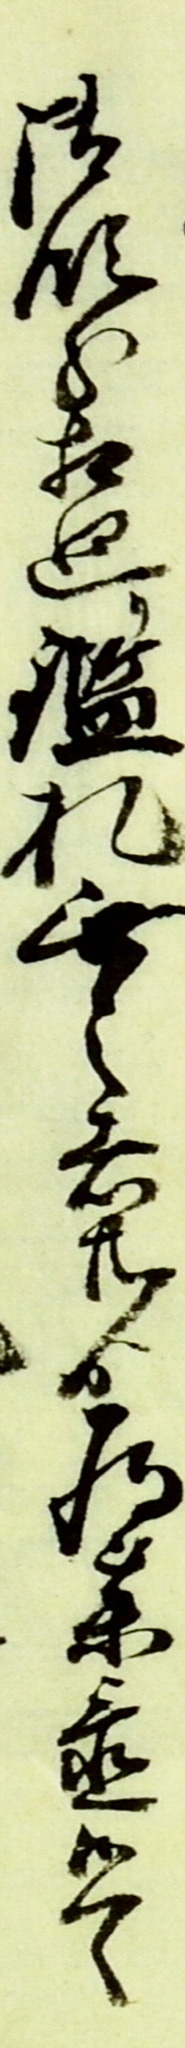御領分相廻り鑑札無之者共ゟ為薬置候ハヽ
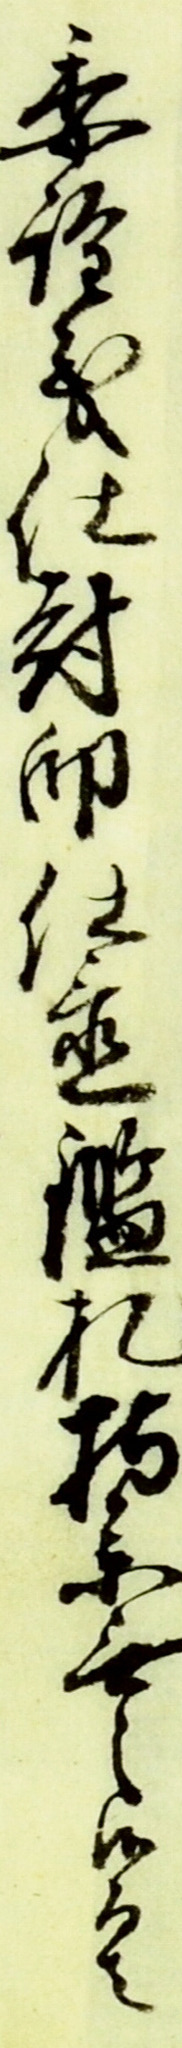委詮義仕封印仕置鑑札持参無之候而者
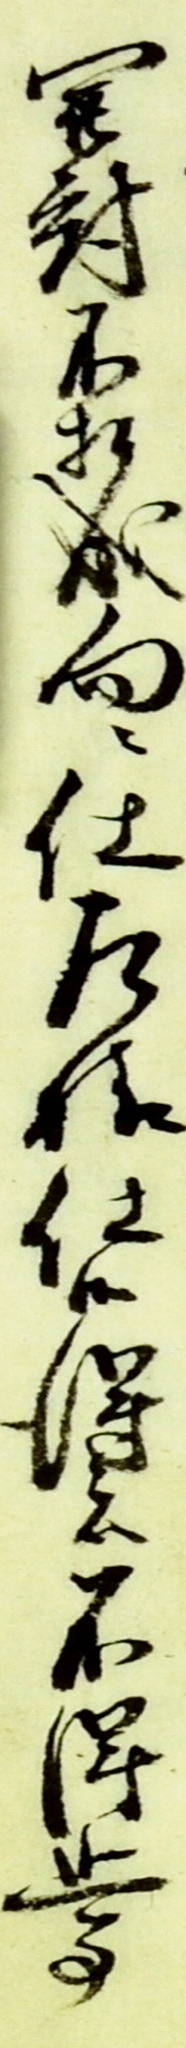開封不相成向ニ仕左様仕候得者不得止事

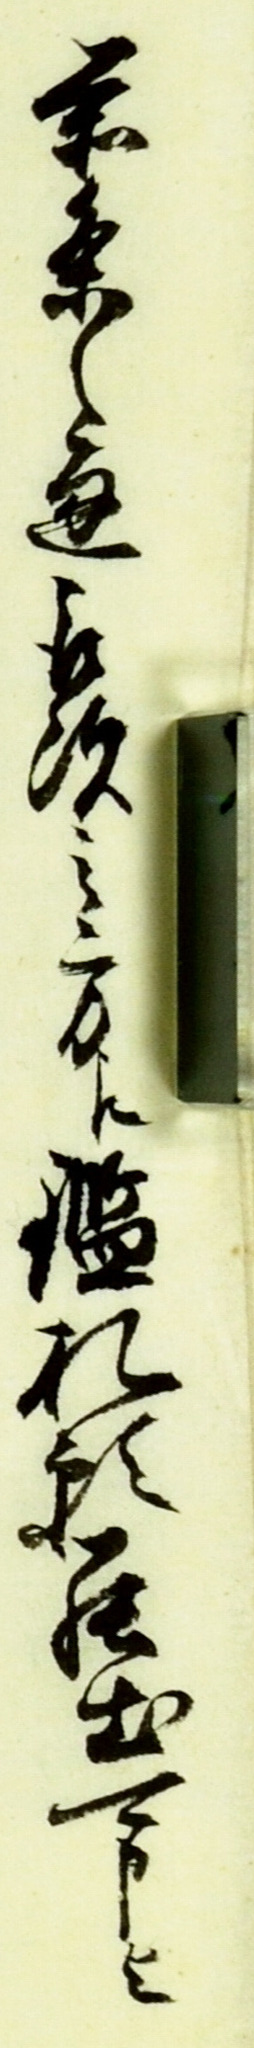前条候通取次之方江鑑札願罷出可申与
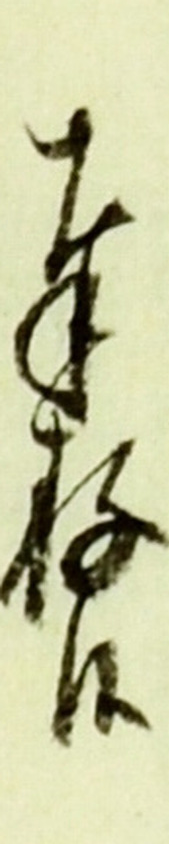奉存候
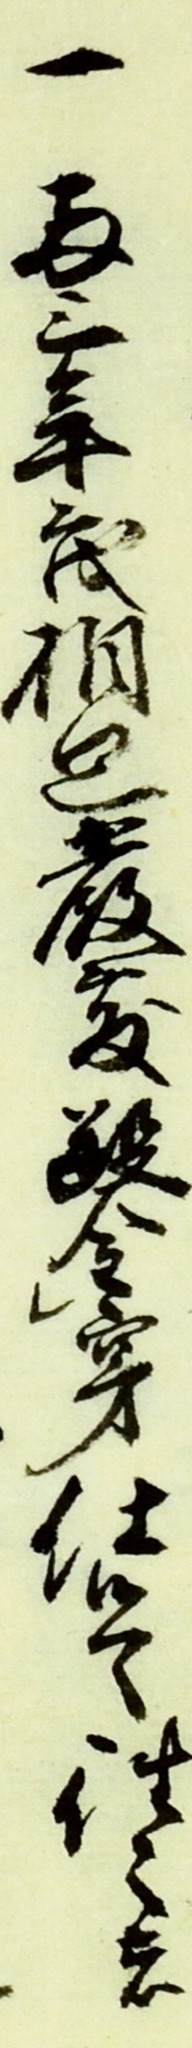一両三年茂相廻厳敷鑿穿仕候ハヽ往々者
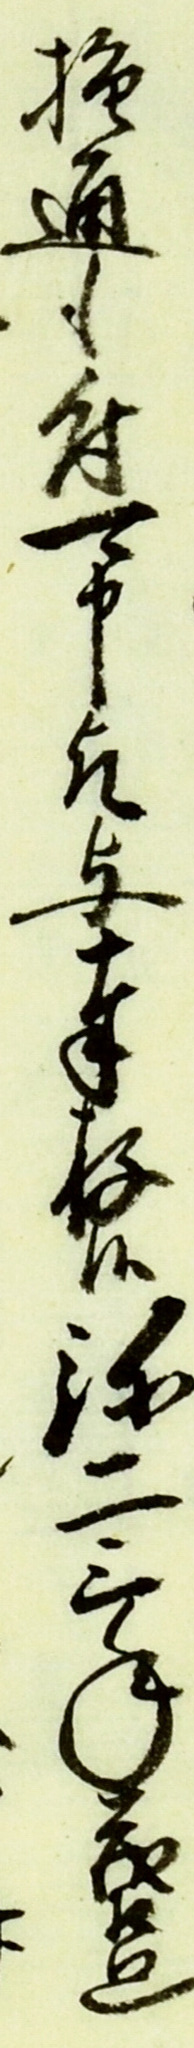抱通も付可申候欤与奉存候弥二三年茂被廻
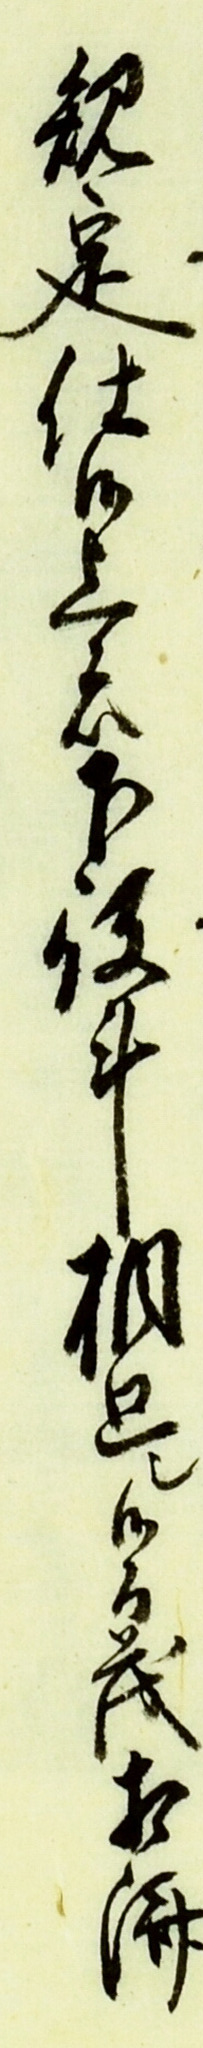規定仕候上者下役計相廻シ候而茂相済
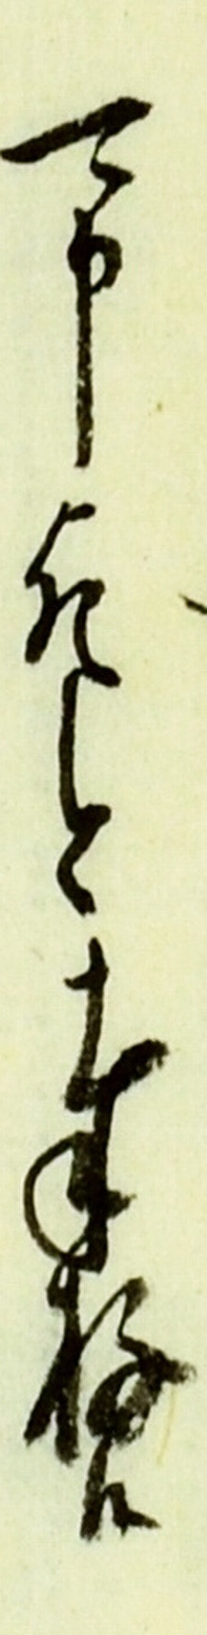可申欤と奉存候
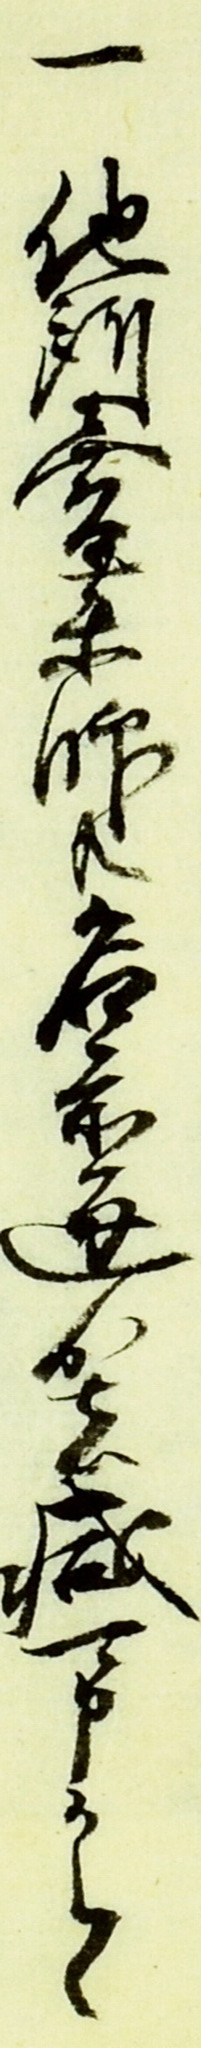一他所売薬師共名前通ゟ者減可申かと
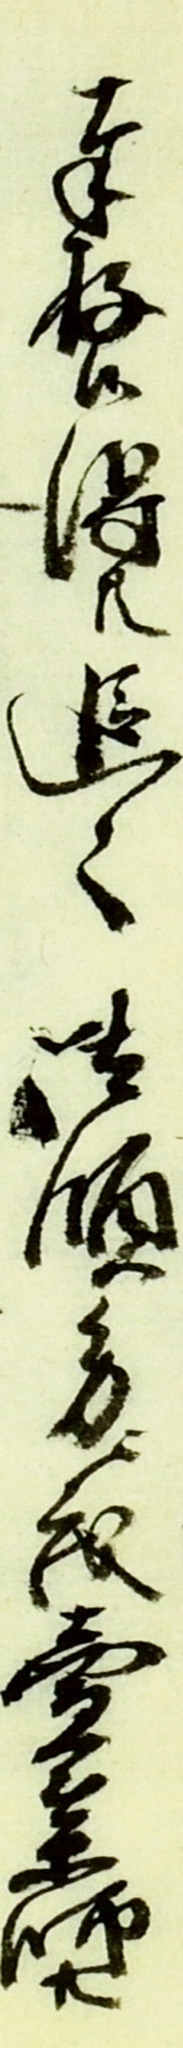奉存候得共追々御領方ニ茂売薬師共
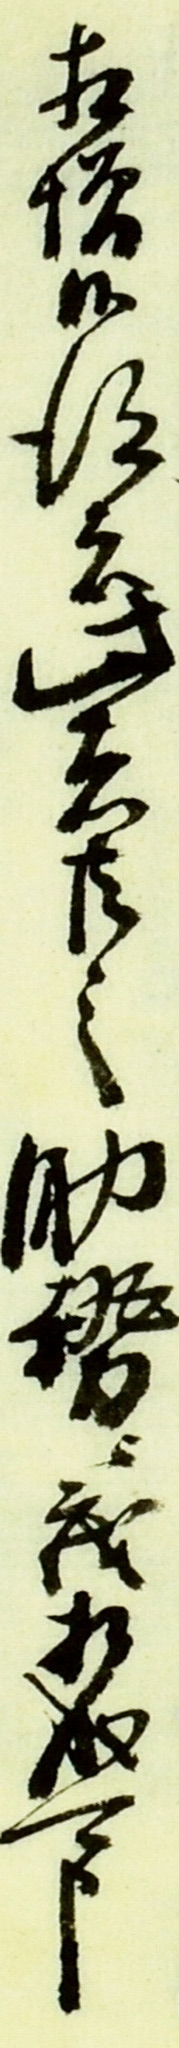相増候得者此者共之助勢ニ茂相成可申
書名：他国賣薬師運上之事
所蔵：伊那市立高遠町図書館・合同会社AMANE
